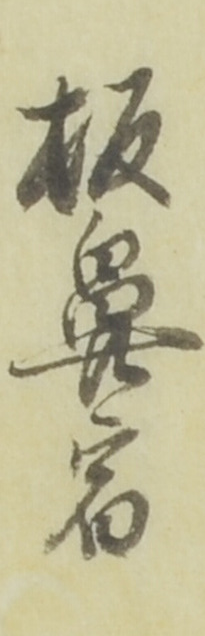板鼻宿
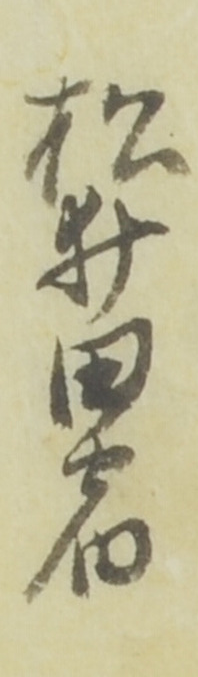松井田宿
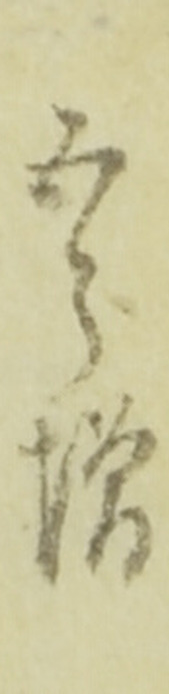五割増
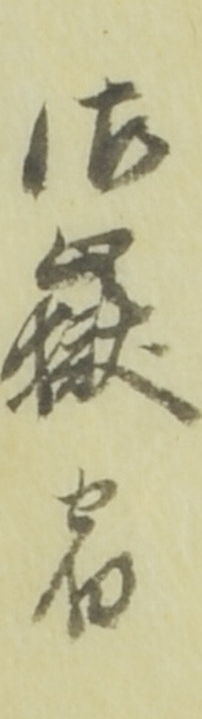御嶽宿
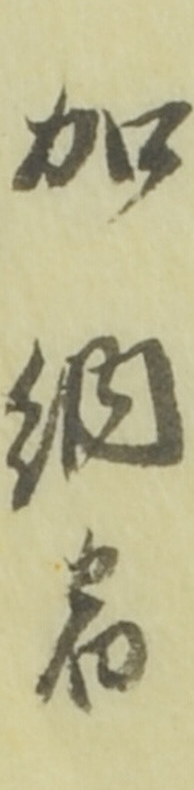加納宿
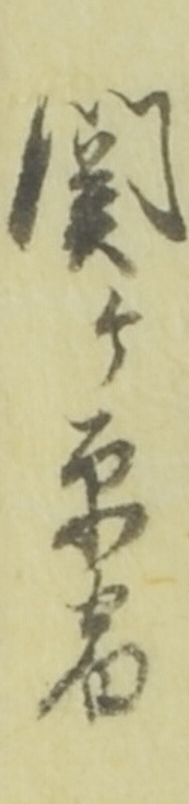関ヶ原宿

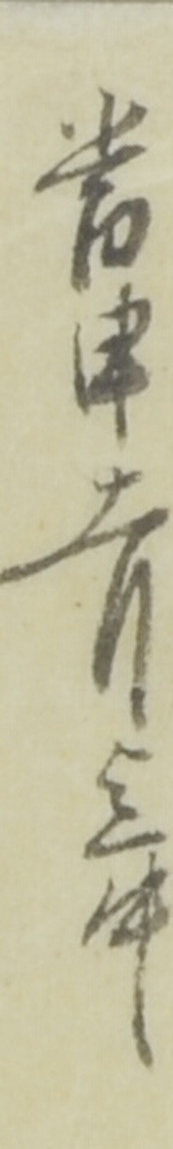当申十一月迄中
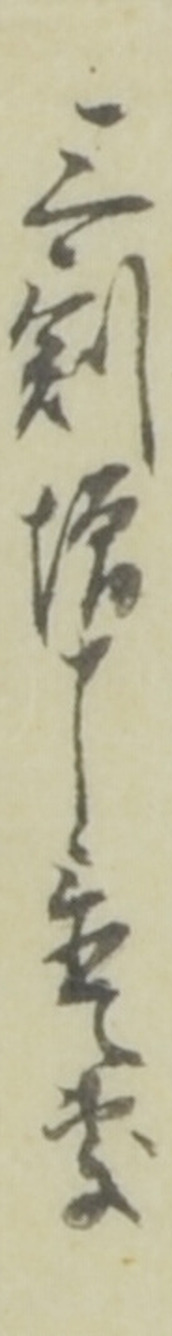三割増申置候処
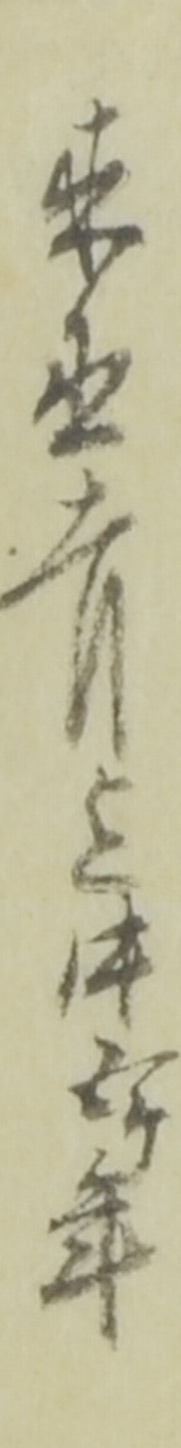来丑十一月迄中五ヶ年
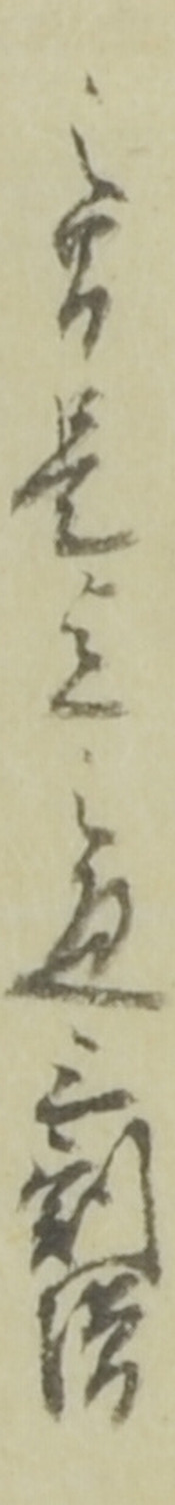之間是迄之通三割増
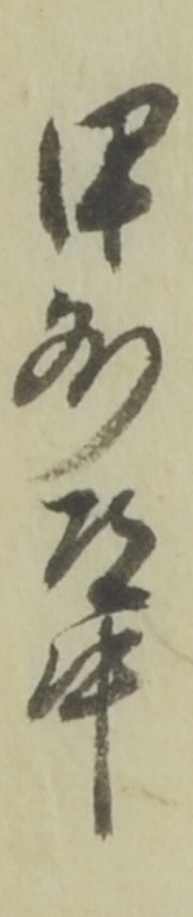甲州道中
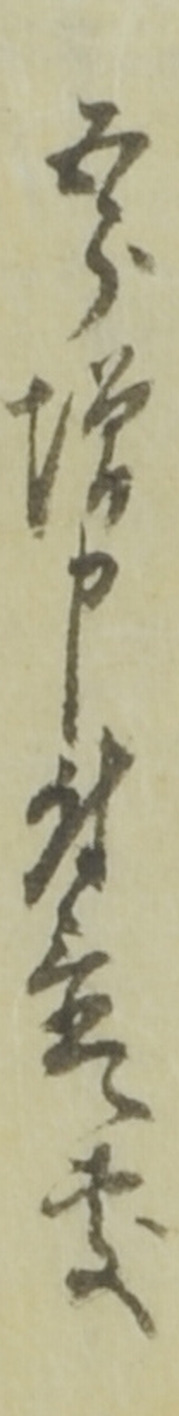五分増申付置候処
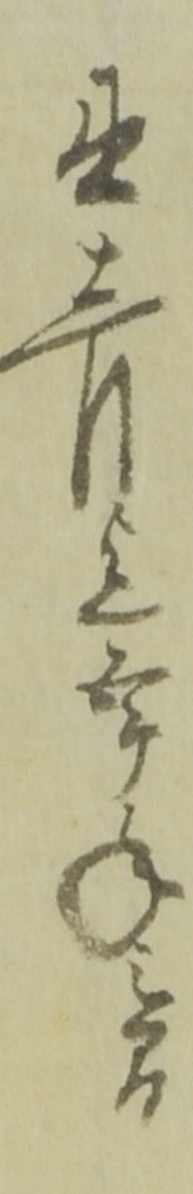丑十二月迄五ヶ年之間
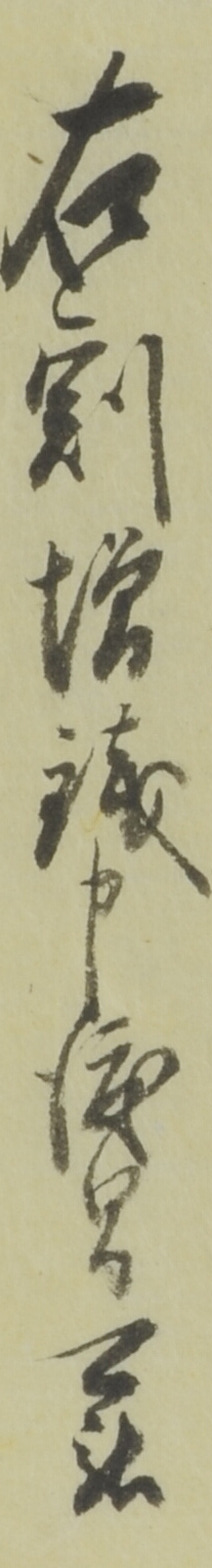右割増銭申渡間可被
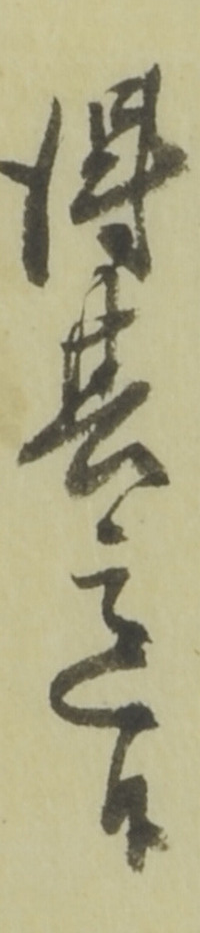得其意候
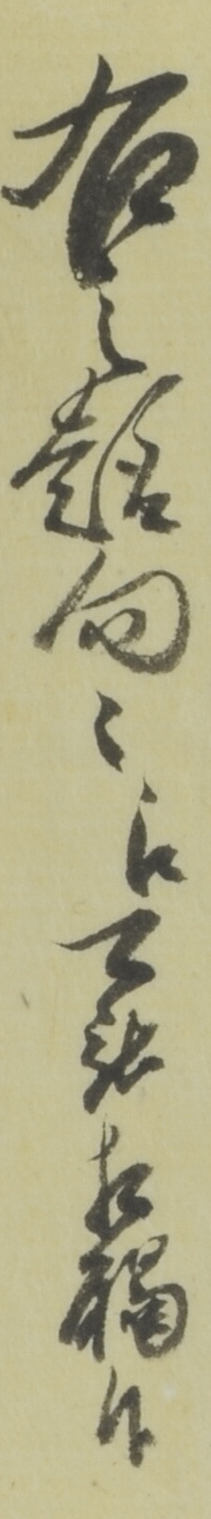右之趣向々江可被相触候
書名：御触書御書附控
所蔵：伊那市立高遠町図書館・合同会社AMANE
